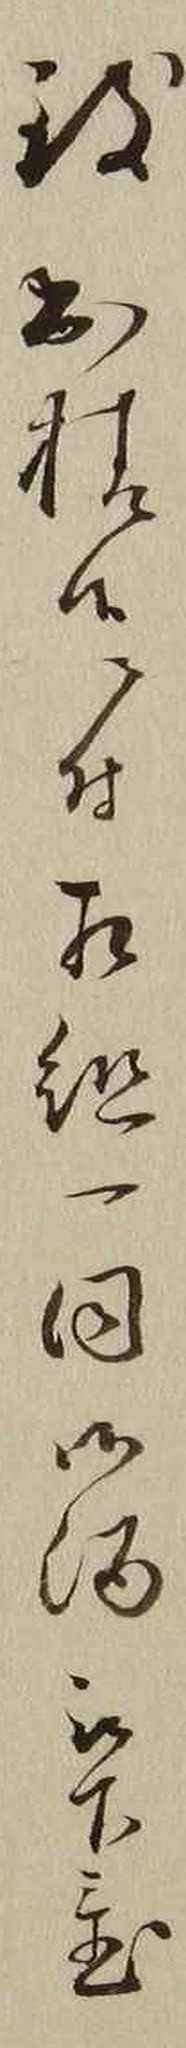致出精候ニ付相組一同御酒被下置
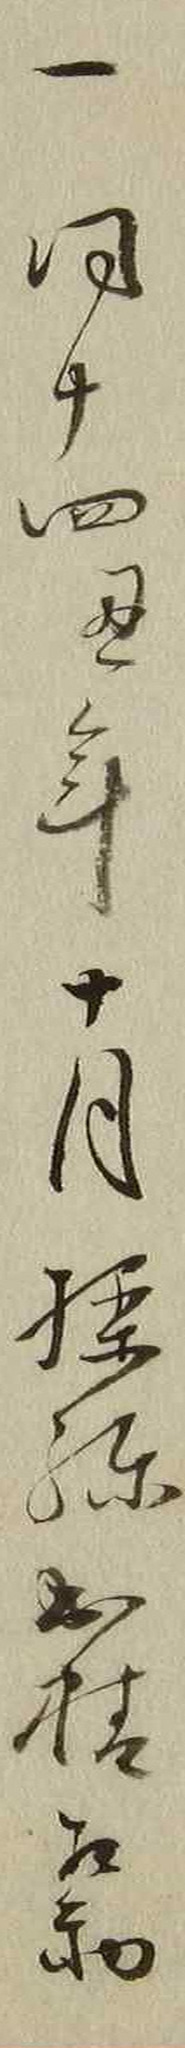一同十四丑年十月操練出精相勤
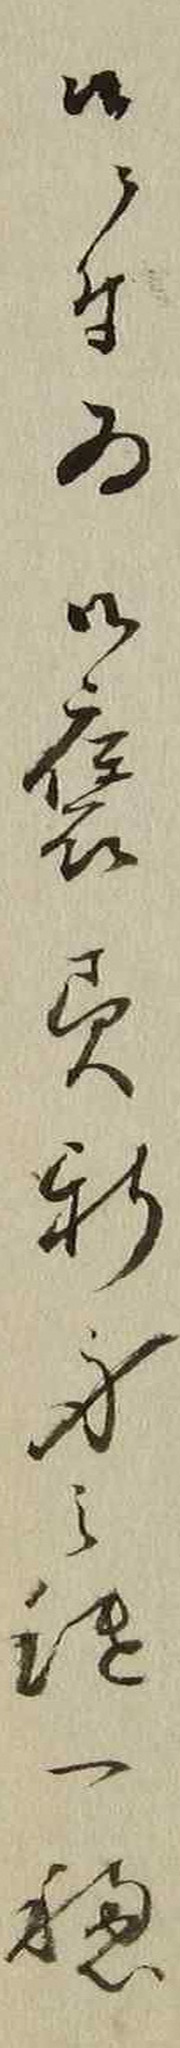候ニ付為御褒美新身之鑓一穂
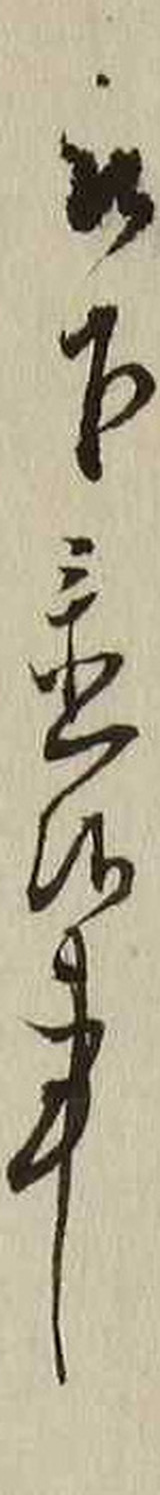被下置候事
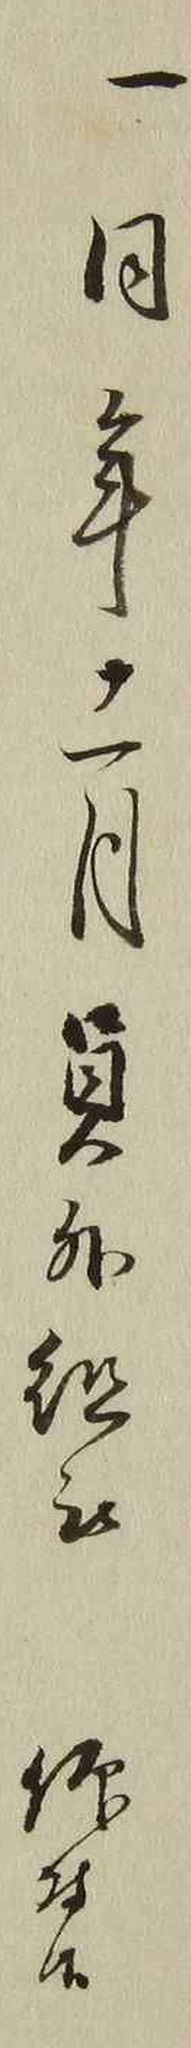一同年十一月員外組被仰付候
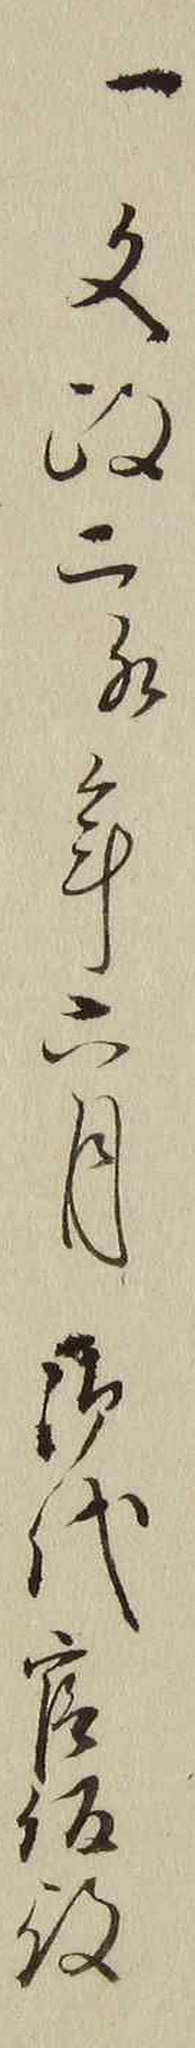一文政二卯年六月御代官仮役
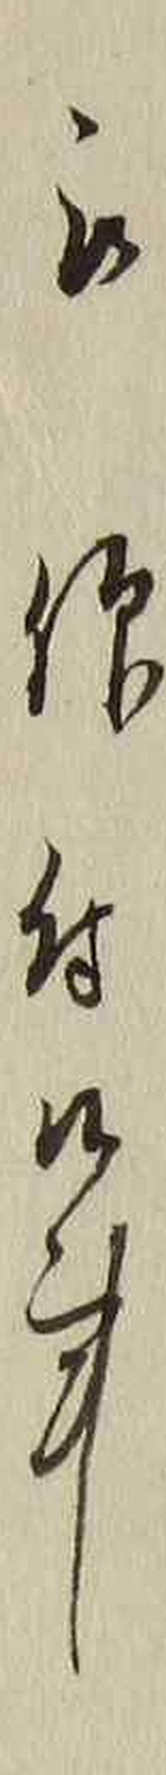被仰付候事
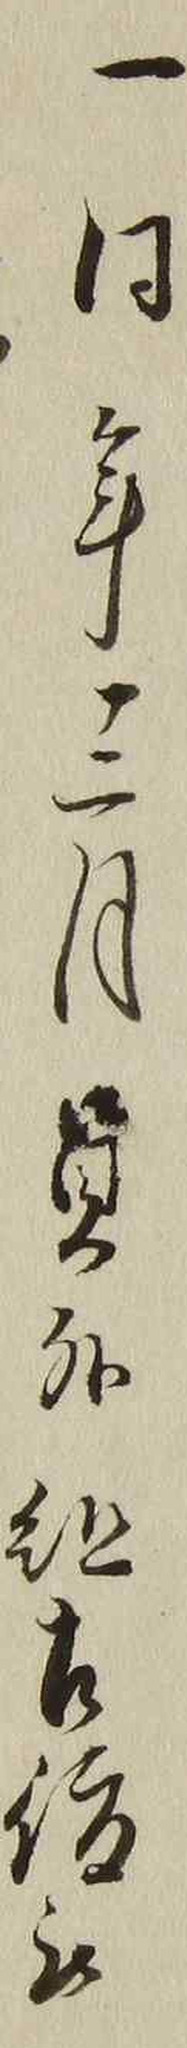一同年十二月員外組古復被
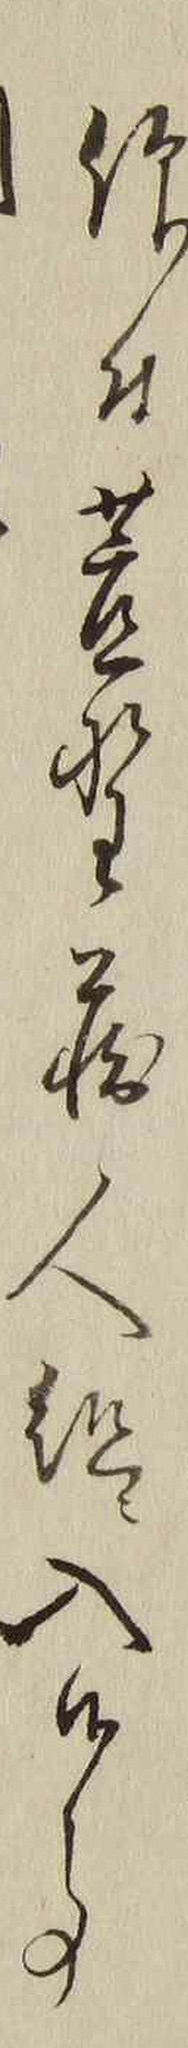仰付萱野蔵人組ニ入候事
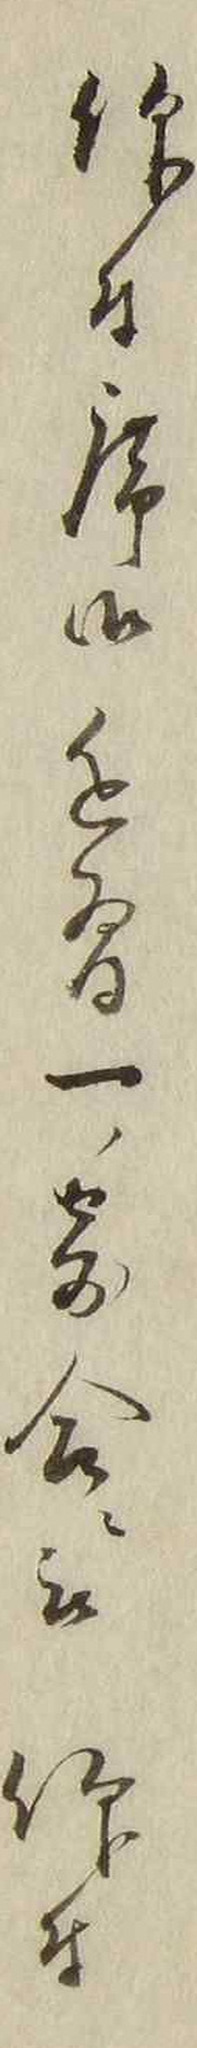仰付席御近習一ノ寄合ニ被仰付

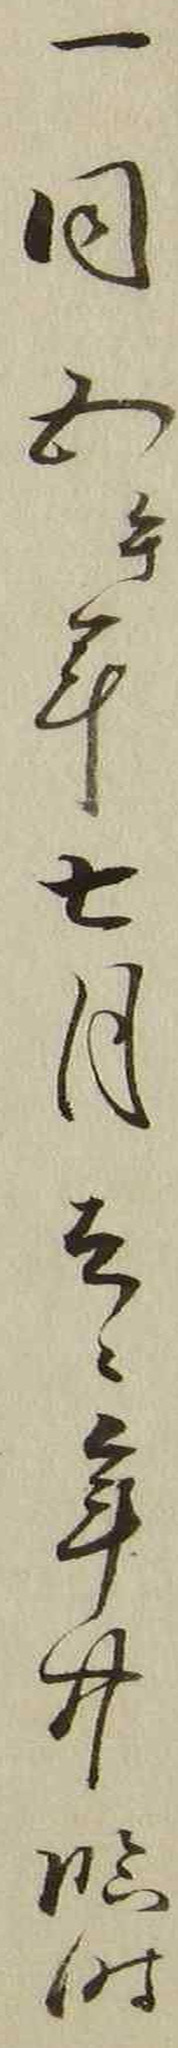一同五午年七月去々年中臨時
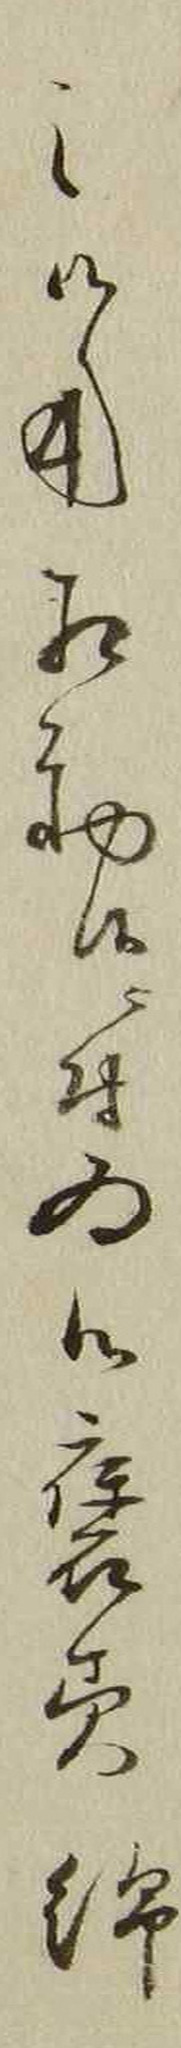之御用相勤候ニ付為御褒美綿
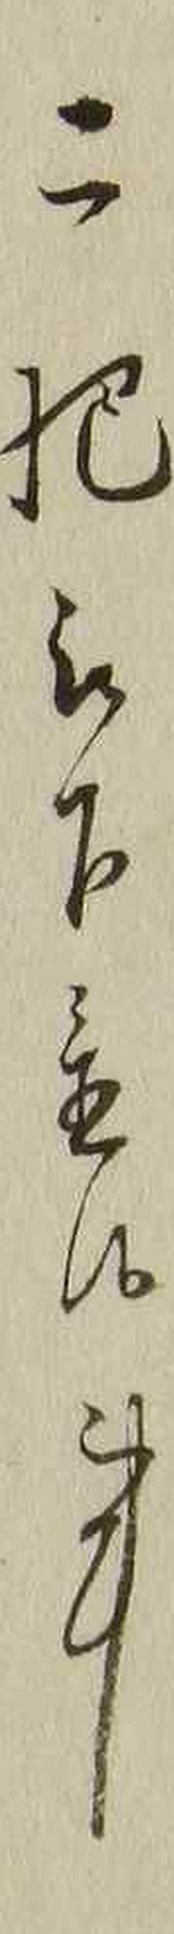二把被下置候事
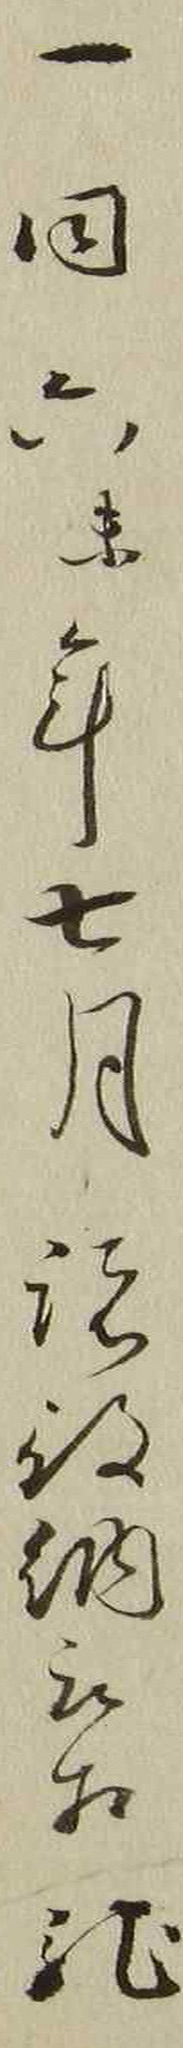一同六未年七月諸役納被相馳
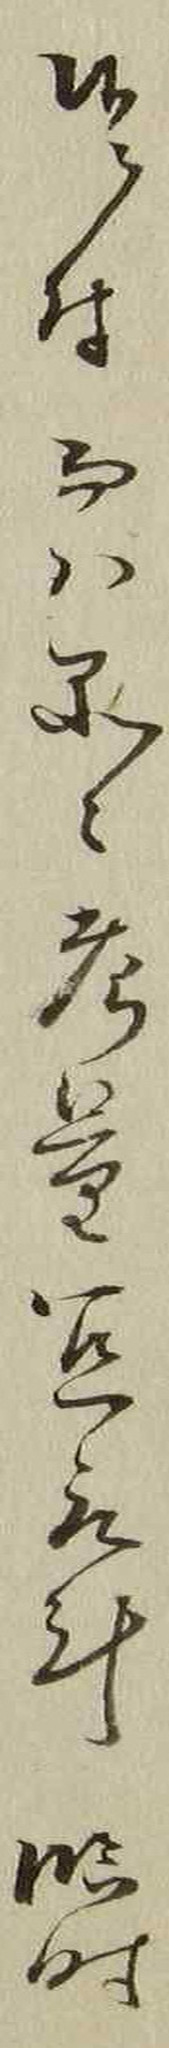候ニ付而ハ品ニ考量宜取計臨時
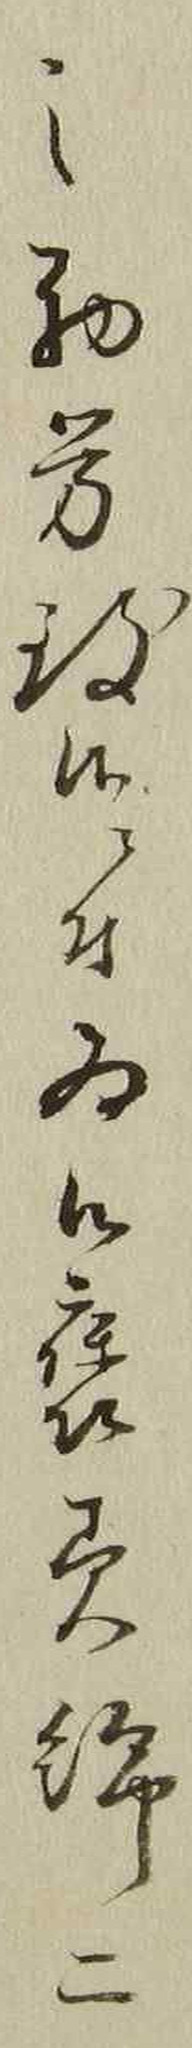之勤労致候ニ付為御褒美綿二
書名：諸士系譜　巻之129　た之部5
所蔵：会津若松市立会津図書館
